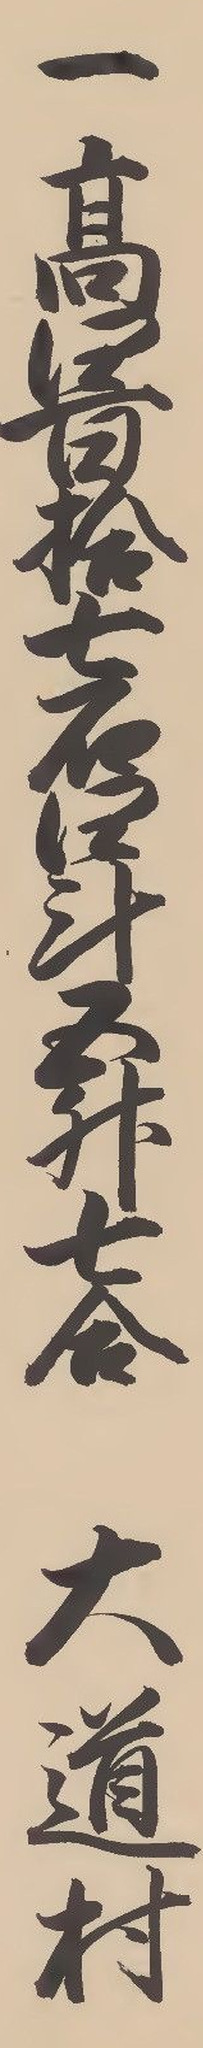一高四百拾七石四斗五升七合大道村
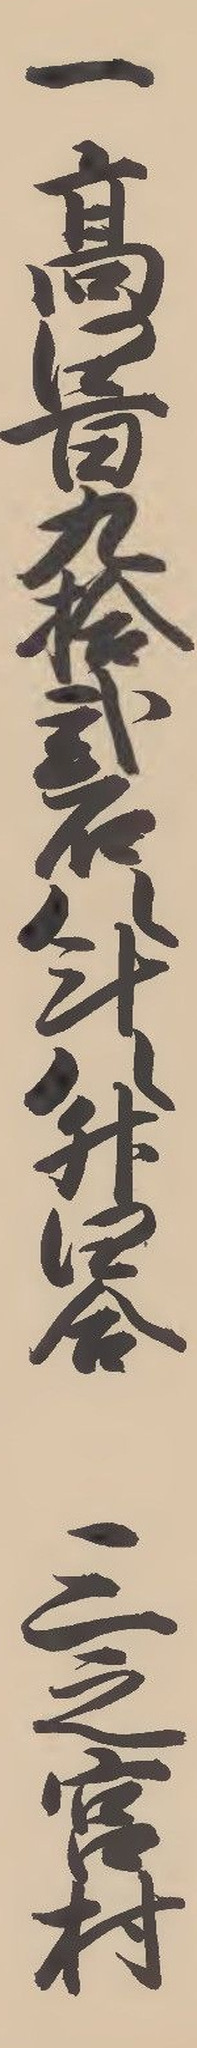一高四百九拾弐石八斗八升四合三之宮村
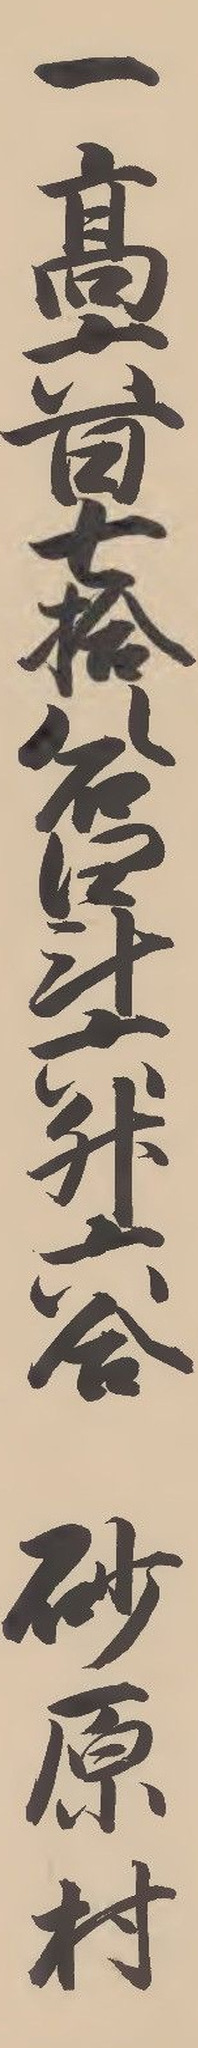一高六百七拾八石四斗六升六合砂原村
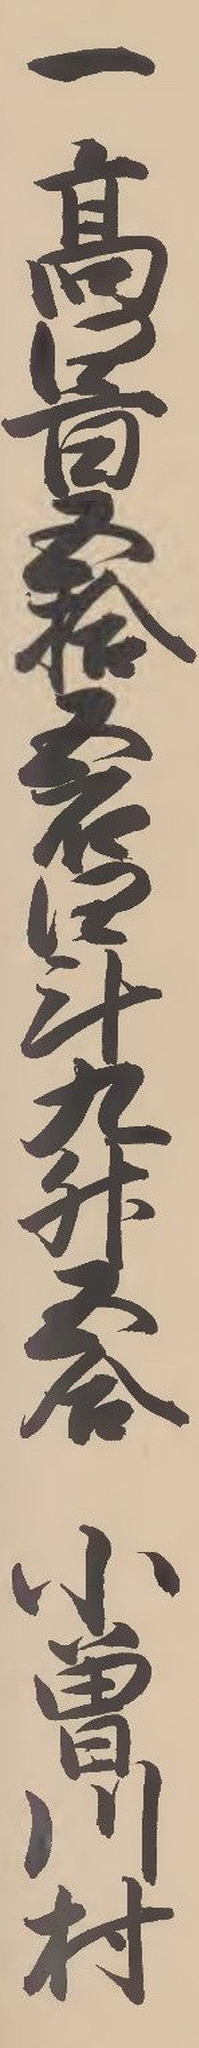一高四百五拾五石四斗九升五合小曽川村
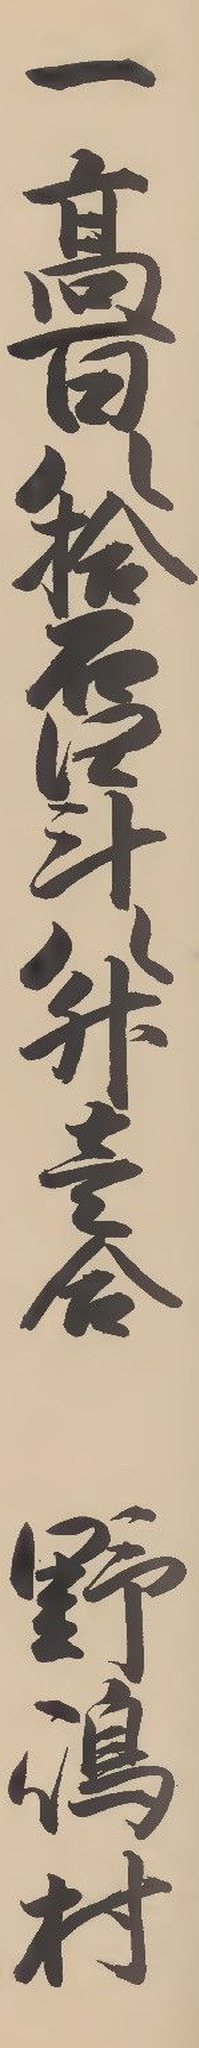一高百八拾石四斗八升壱合野嶋村
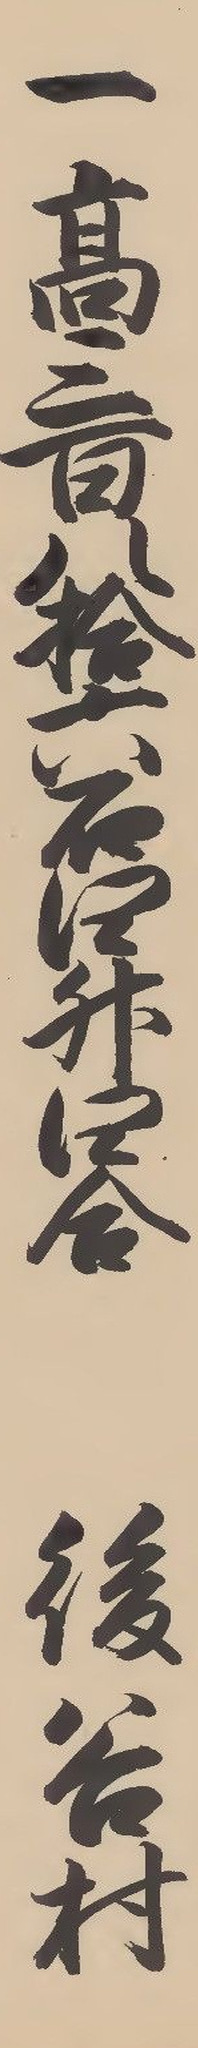一高三百八拾六石四升四合後谷村
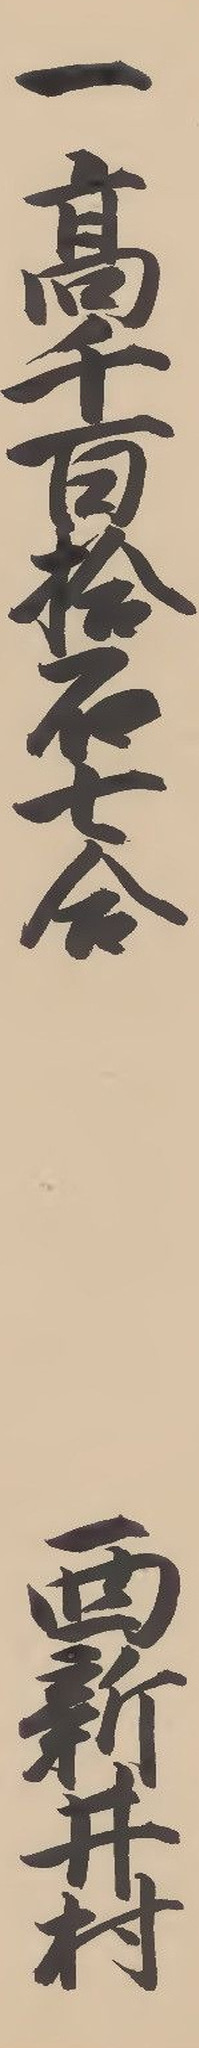一高千百拾石七合西新井村
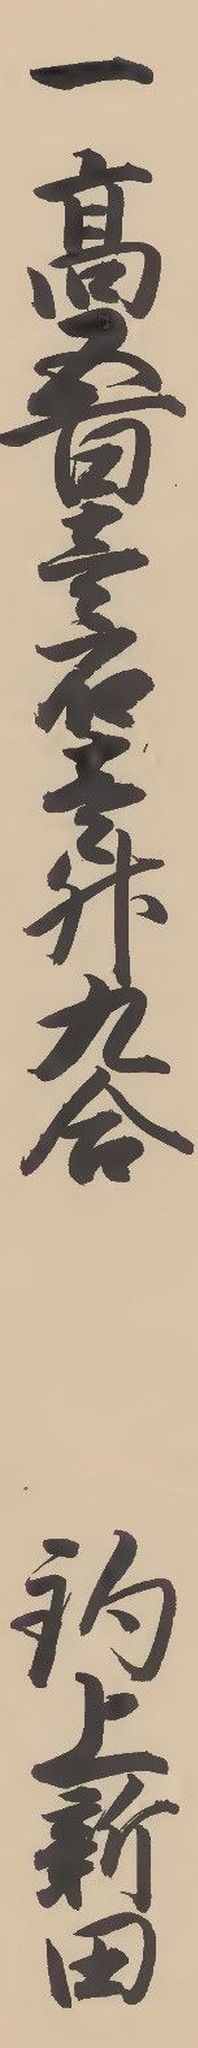一高五百壱石壱升九合釣上新田

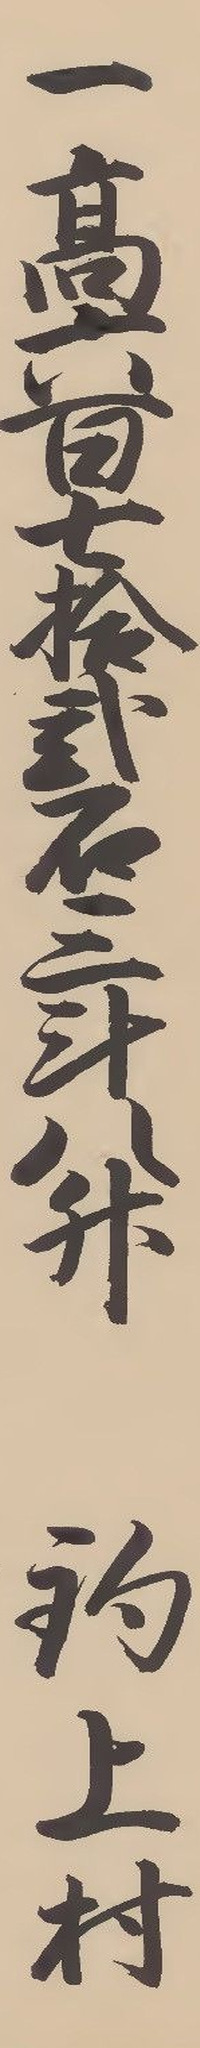一高六百七拾弐石三斗八升釣上村
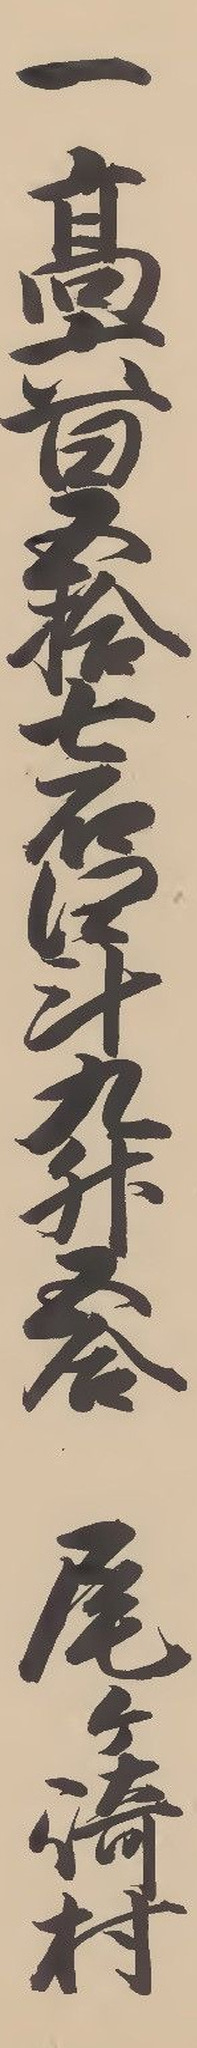一高六百五拾七石四斗九升五合尾ヶ崎村
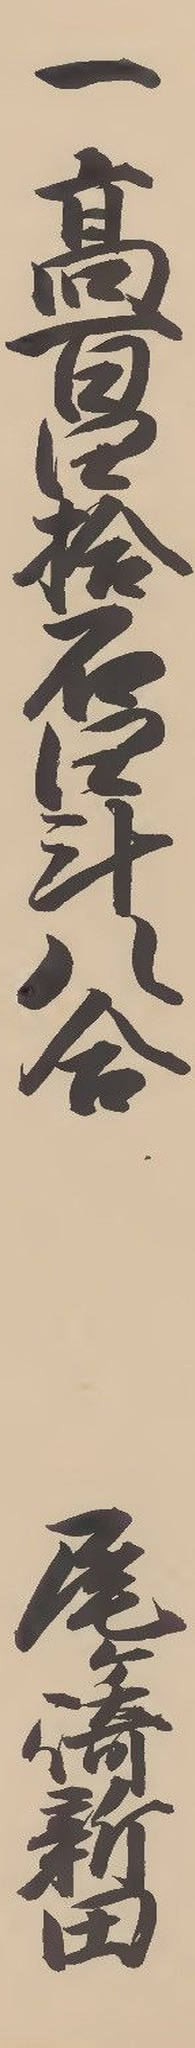一高百四拾石四斗八合尾ヶ崎新田
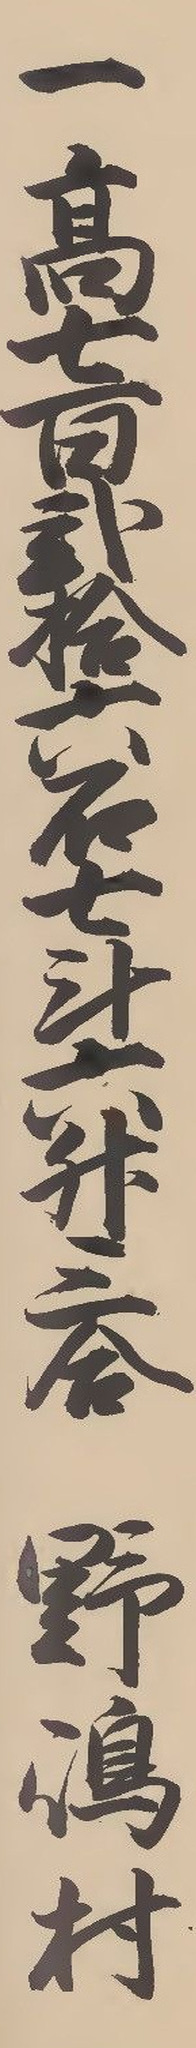一高七百弐拾六石七斗六升三合野嶋村
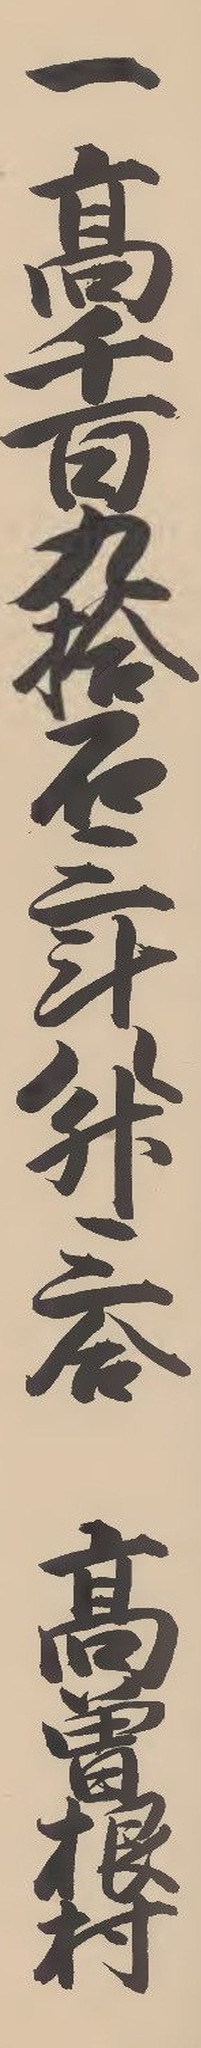一高千百九拾石三斗八升三合高曽根村
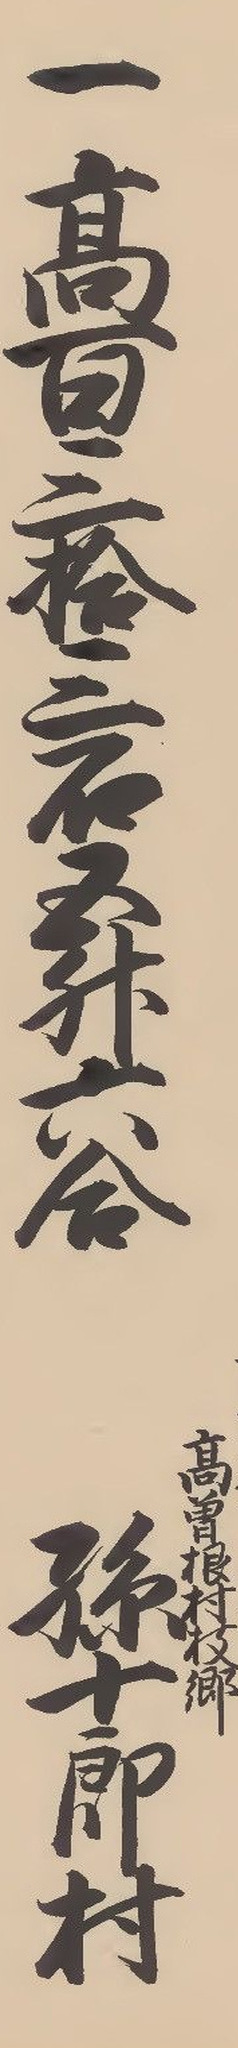一高百三拾三石五升六合孫十郎村
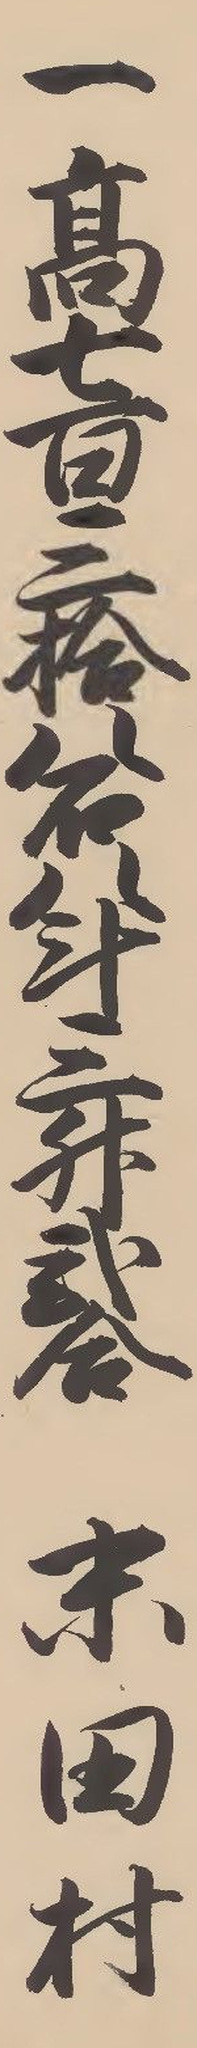一高七百三拾八石八斗三升弐合末田村
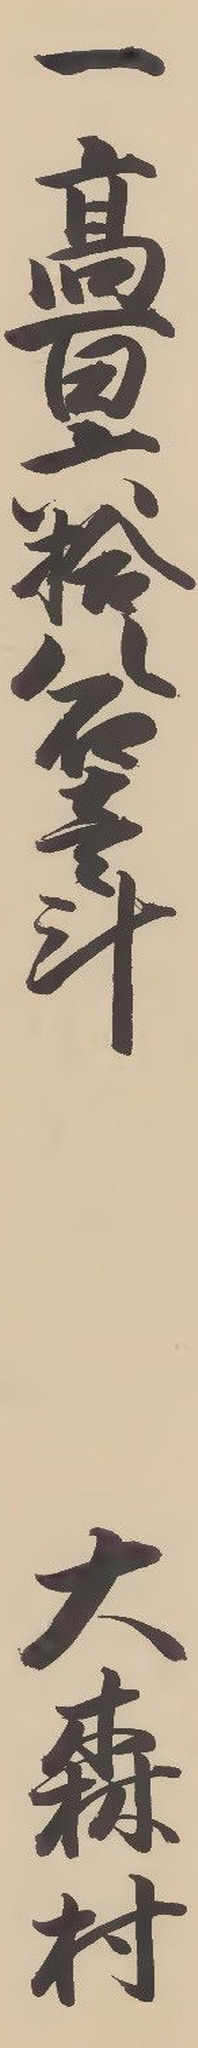一高百六拾八石壱斗大森村
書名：武蔵国郷帳　下
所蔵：国立公文書館 National Archives of Japan
